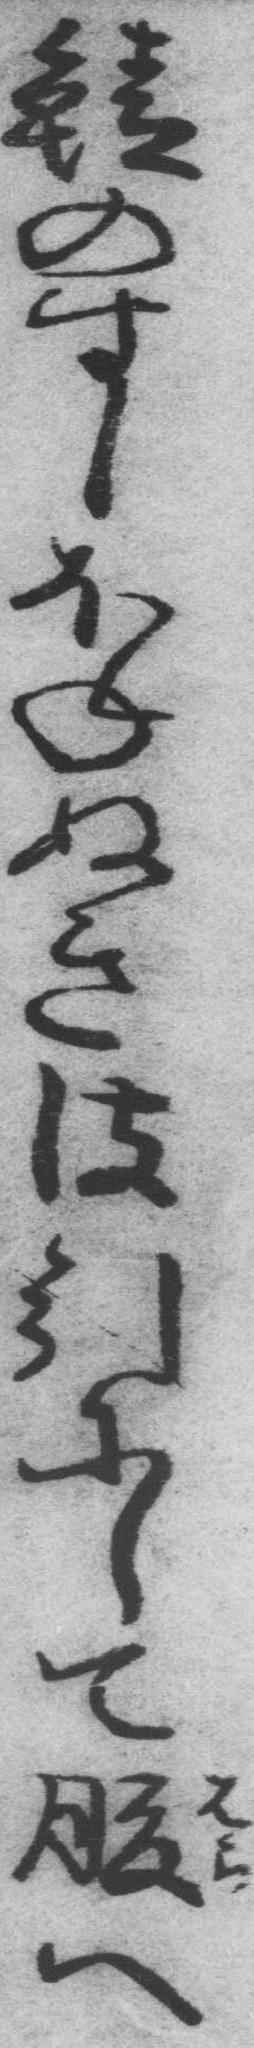鯖のすしほねぬき皮引にして腹へ

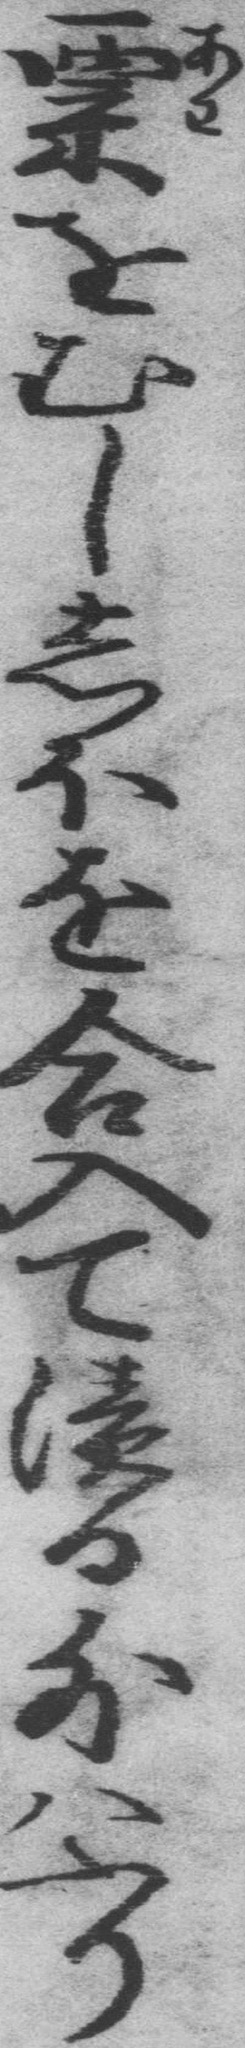粟をむししほを合入て漬る外はふり
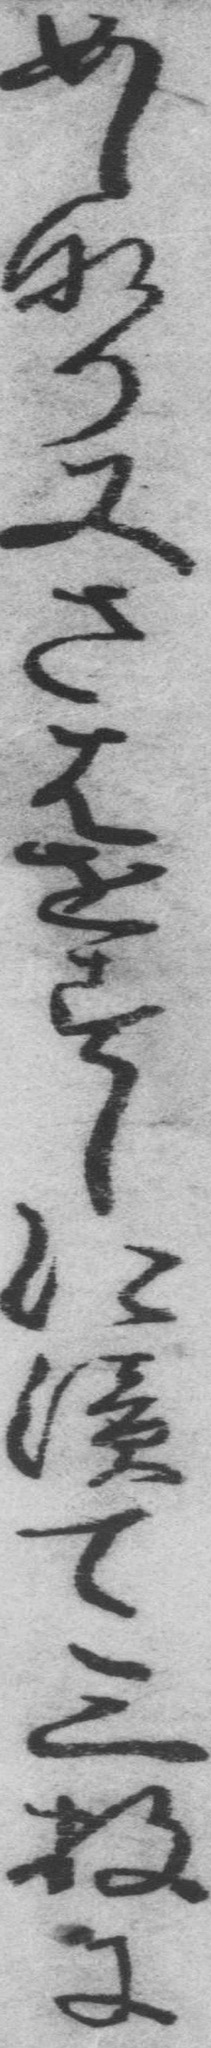めしなり又さはをすしに漬て三枚に
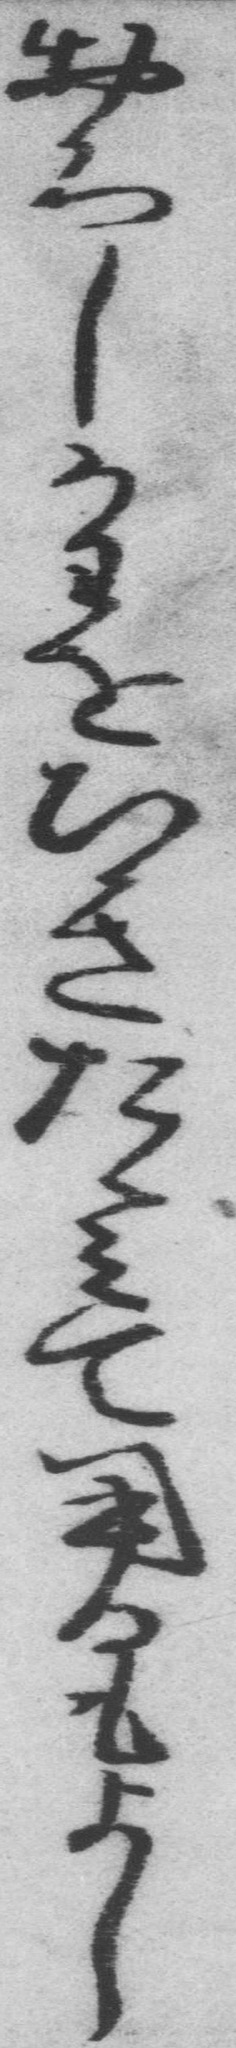おろしかわをひきたゝみて用るもよし
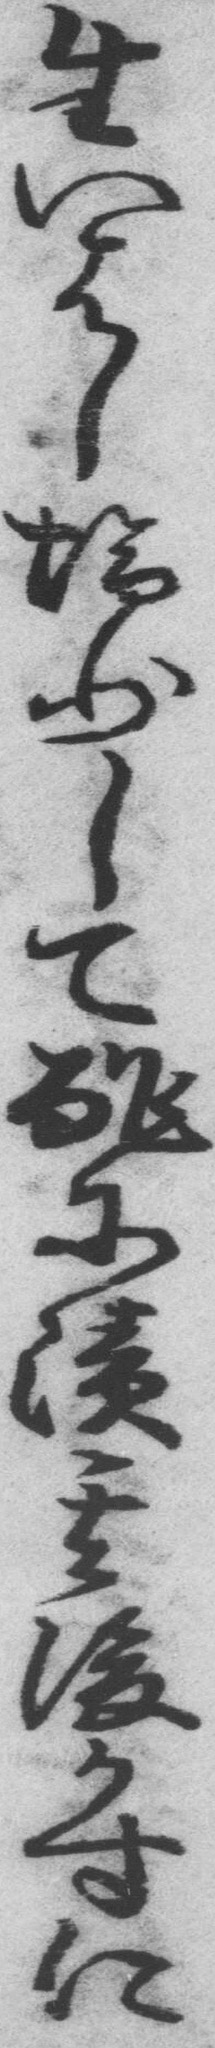生いはし塩少して酢に漬其後かすに
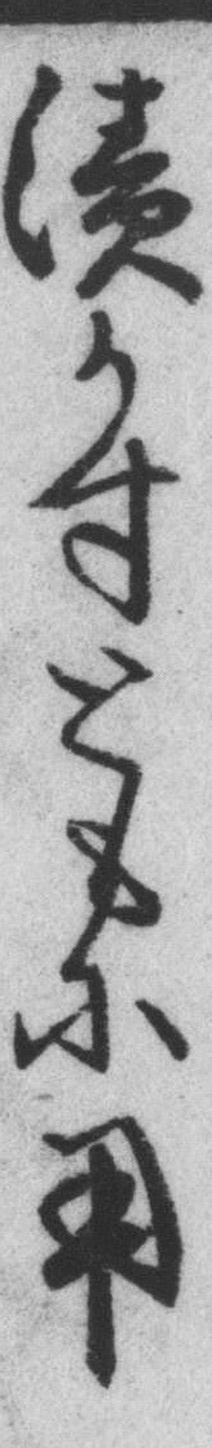漬かすともに用
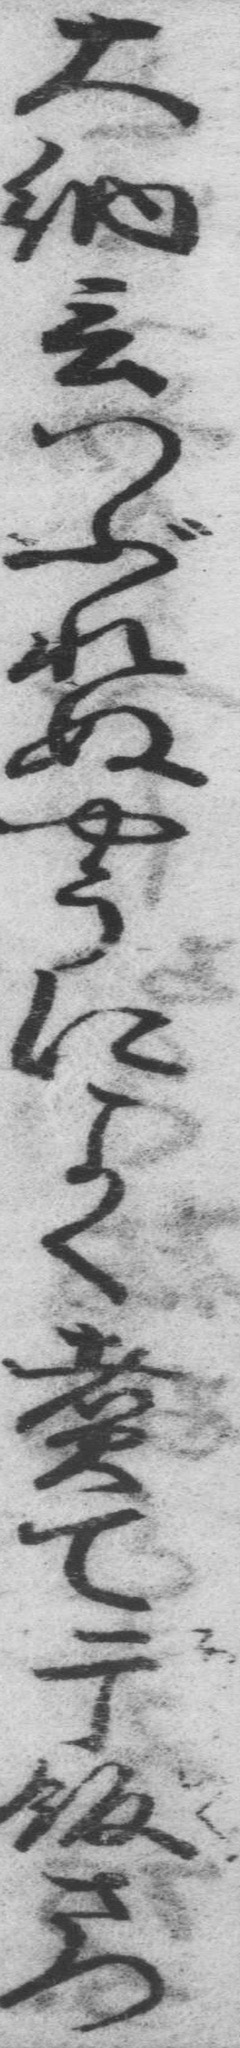大納言つぶれぬやうによく煮て干飯さつ
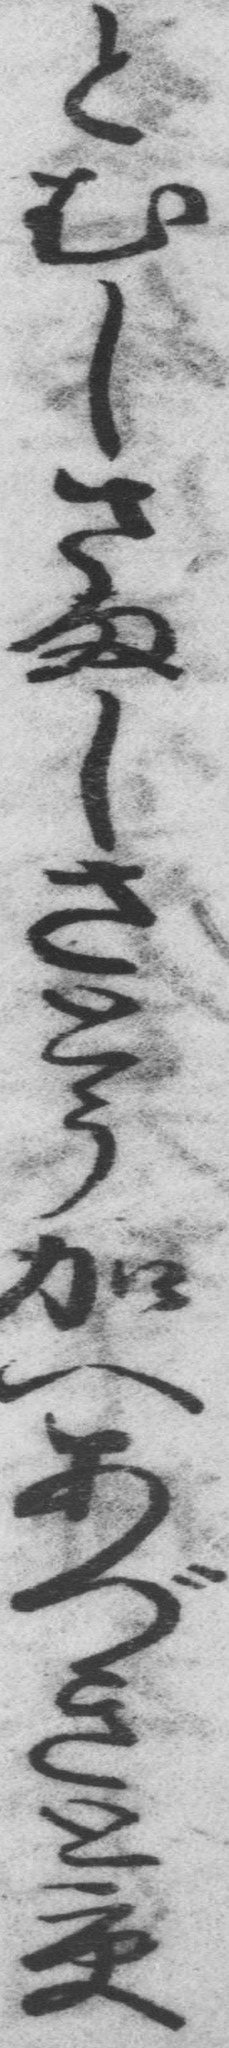とむしさましさとう加へあづきと交
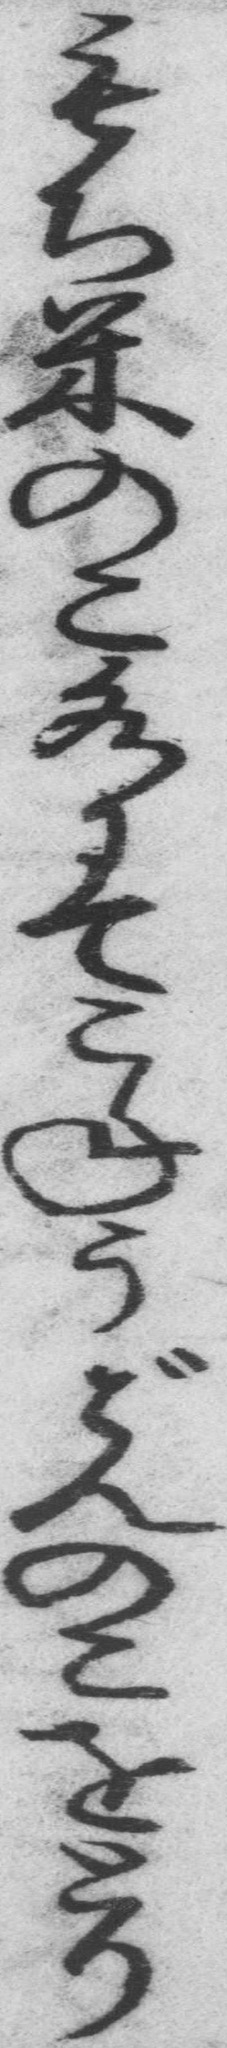もち米のこ水にてこねうどんのこをとり
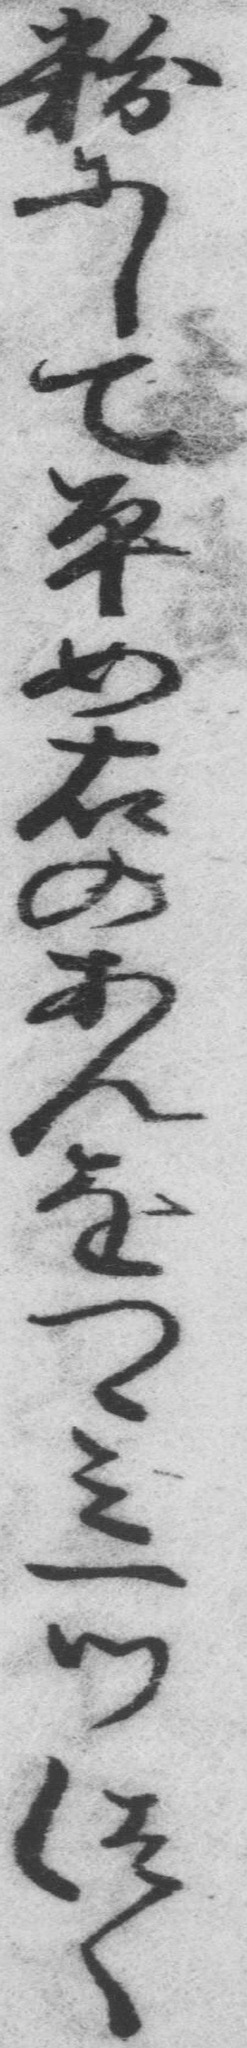粉にして平め右のあんをつゝみ一ツつゝ
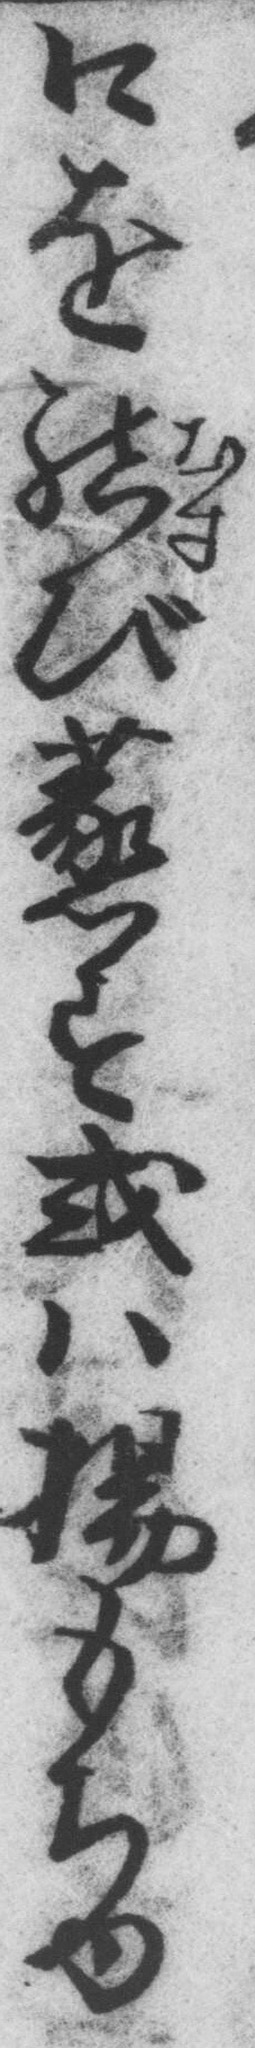口を結び蒸す或は揚もちゆ
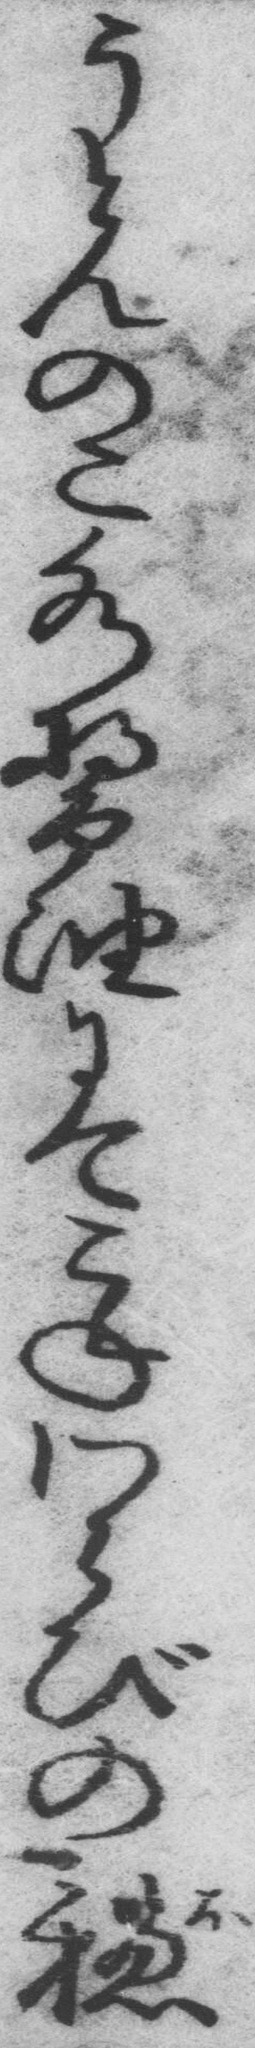うとんのこ水醤油にてこねわらびの穂
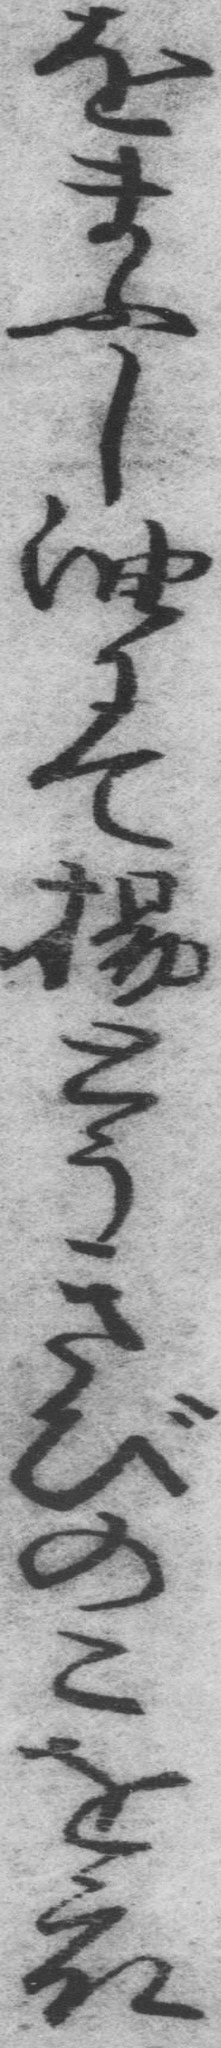をまふし油にて揚とうきびのこを衣

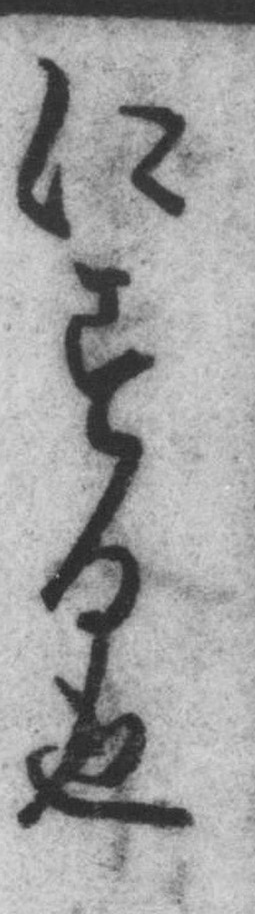にする也
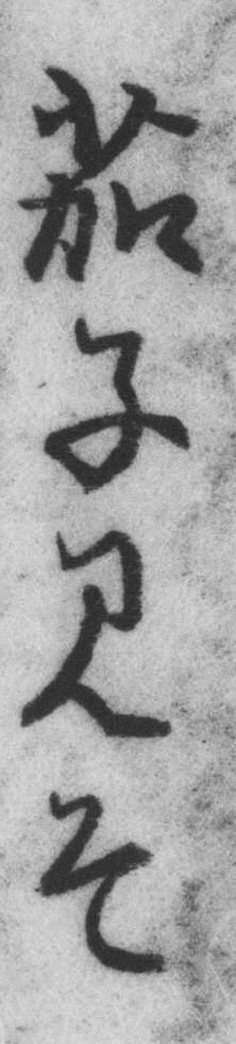茄子みそ
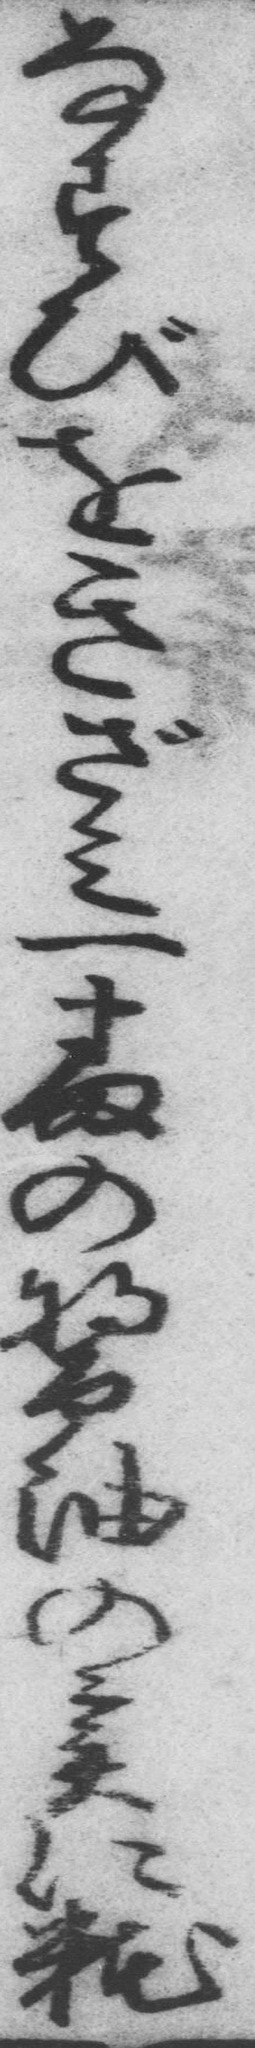なすびをきざみ一番の醤油の実に糀
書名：料理山海郷
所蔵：大阪府立大学学術情報センター 国文学研究資料館
